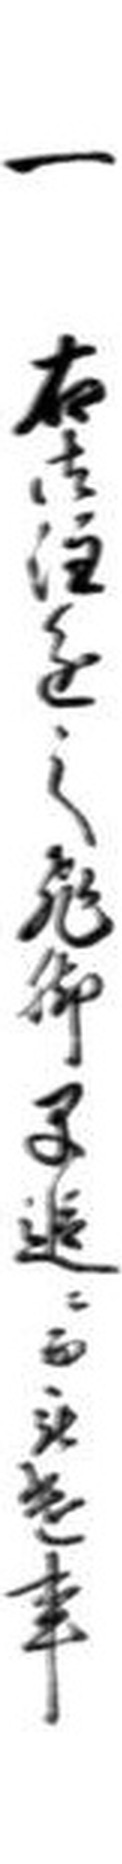一右御注進之飛脚早追ニ而被遣事
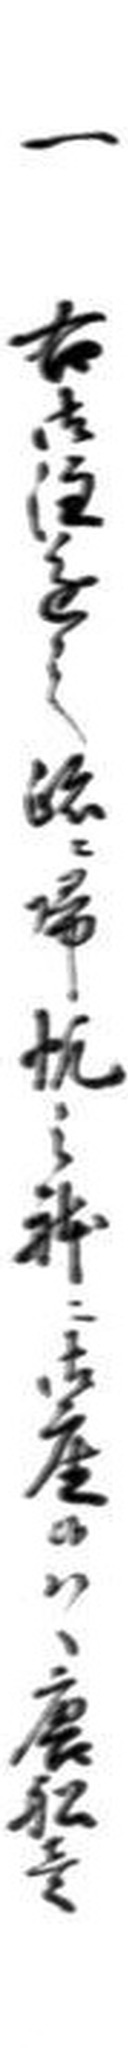一右御注進之跡ニ帰帆之体ニ御座候ハヽ唐船壱
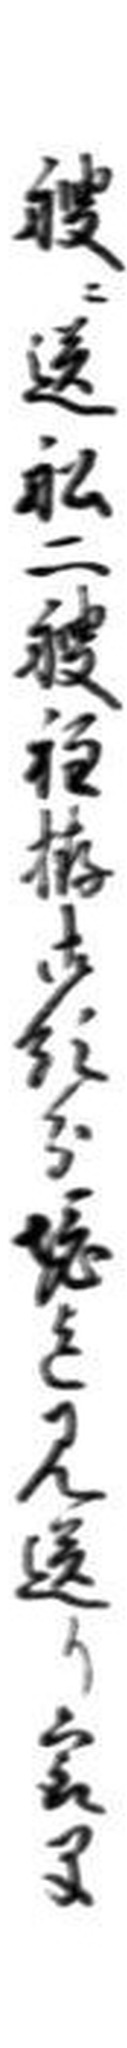艘ニ送船二艘程拵御領分境迄見送り最早
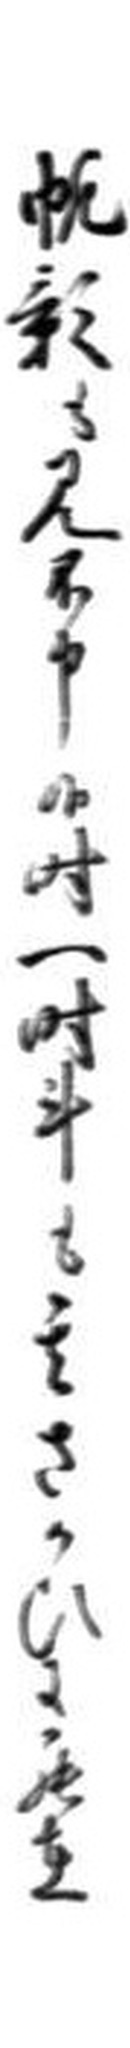帆影も見不申候時一時斗も其さかひに罷在
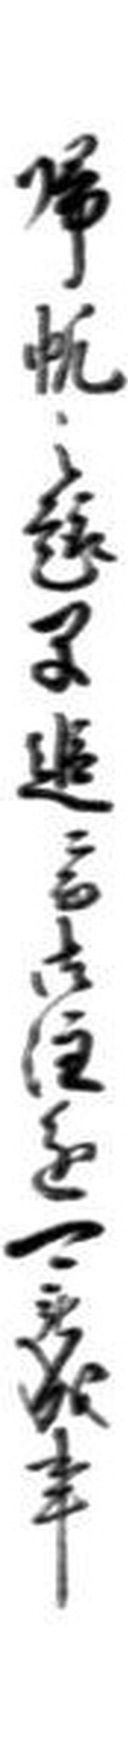帰帆之趣早追ニ而御注進可被成事
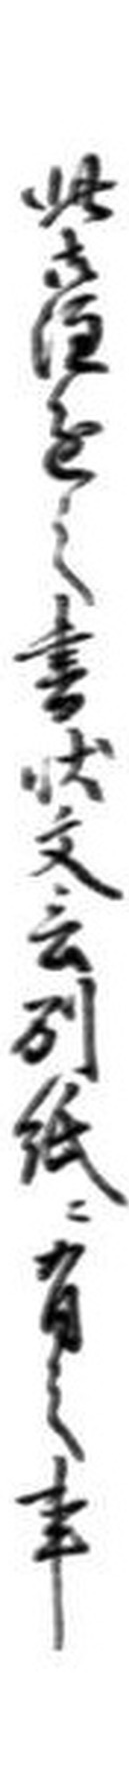此御注進之書状文言別紙ニ有之事
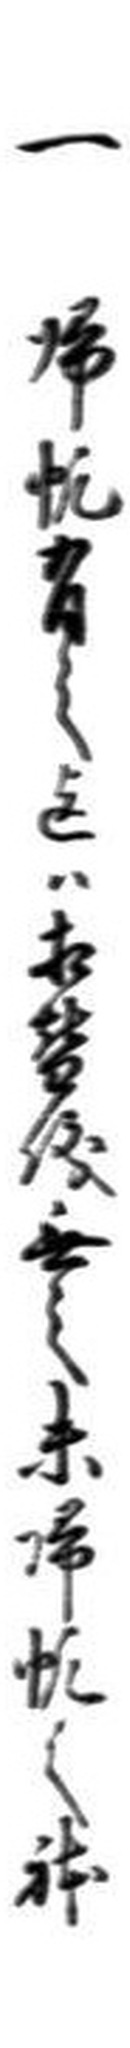一帰帆有之迄ハ相替儀無之未帰帆之体
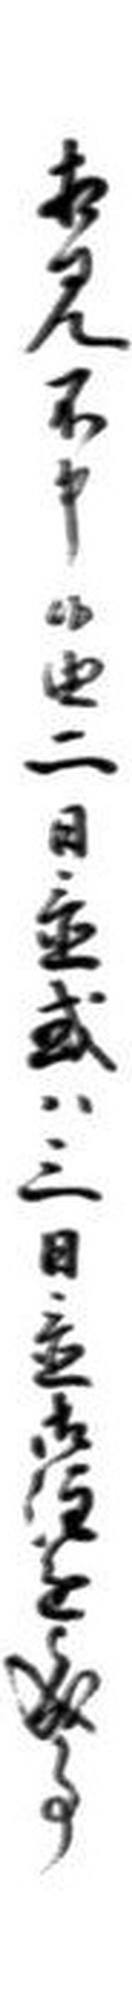相見不申候由二日置或ハ三日置御注進被成事
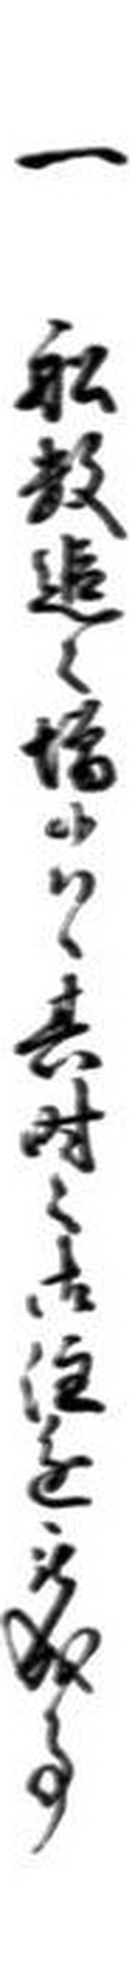一船数追々増候ハヽ其時々御注進被成事

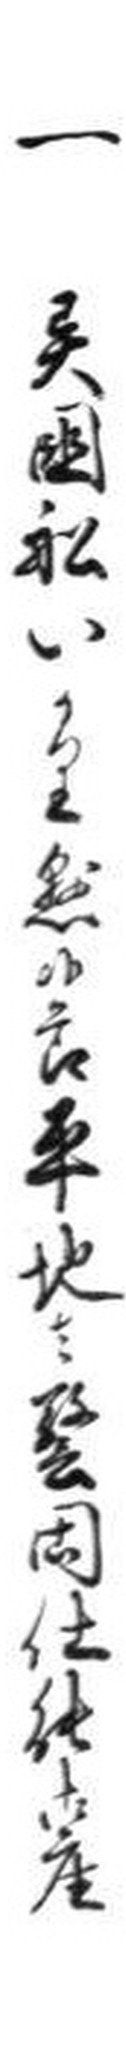一異国船いかり懸候節平地者警固仕能御座
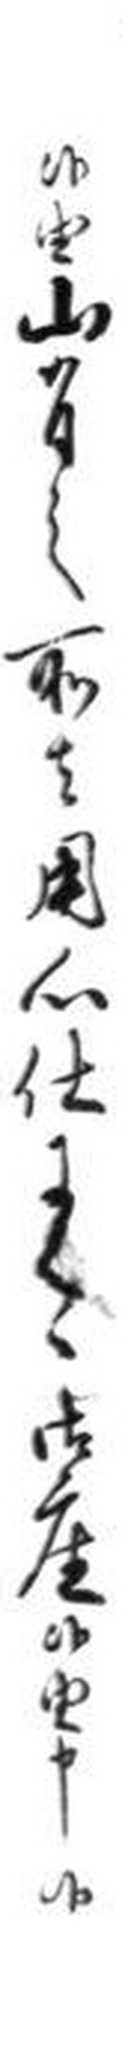候由山有之所者用心仕にくゝ御座候由申候
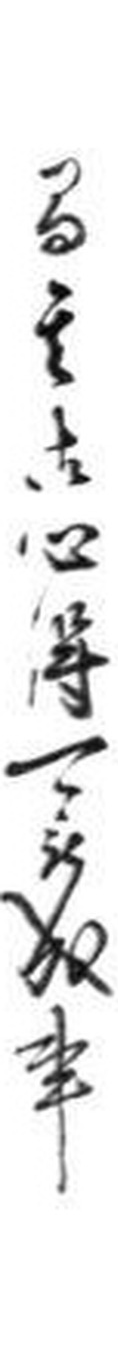間其御心得可被成事
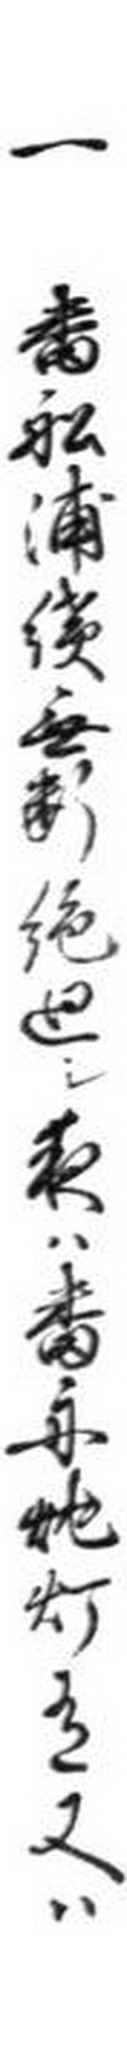一番船浦続無断絶廻シ夜ハ番舟烑灯有又ハ
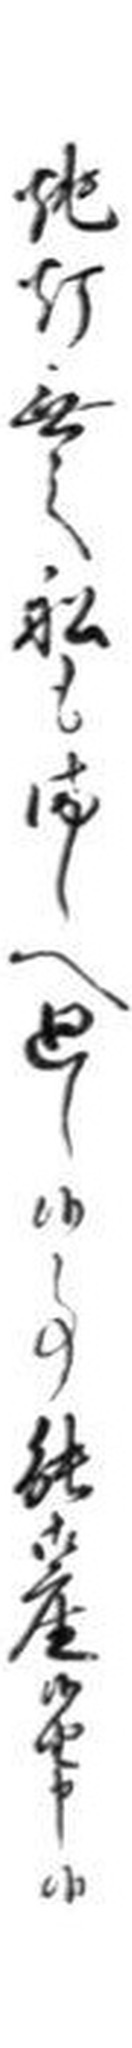烑灯無之船もましへ廻し候事能御座候由申候
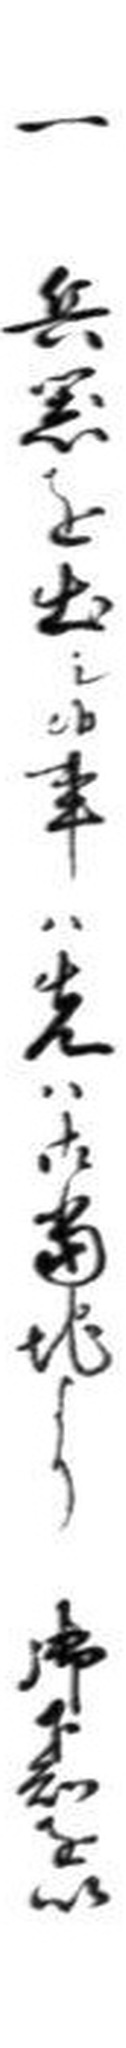一兵器を出シ候事ハ先ハ御当地より御下知を以
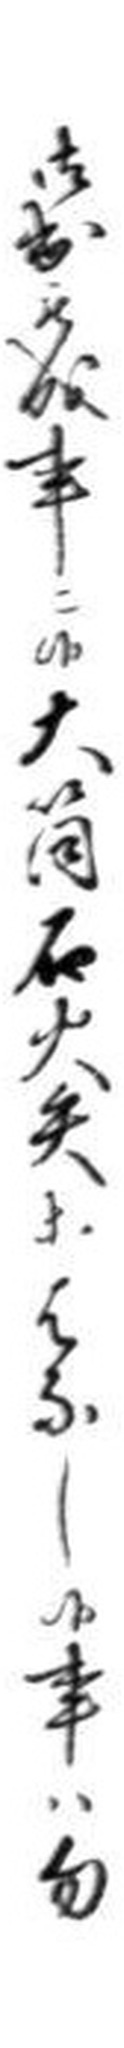御出被成事ニ候大筒石火矢等はなし候事ハ勿
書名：家譜 三十二 吉邦公 従享保二年到享保三年
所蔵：福井県文書館 Fukui Prefectural Archives
